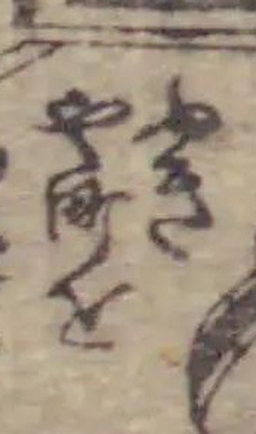や町を
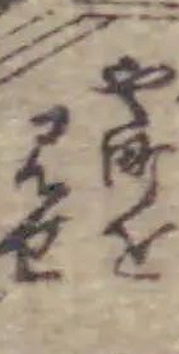や町を
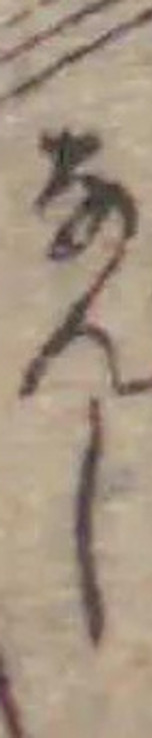なんし
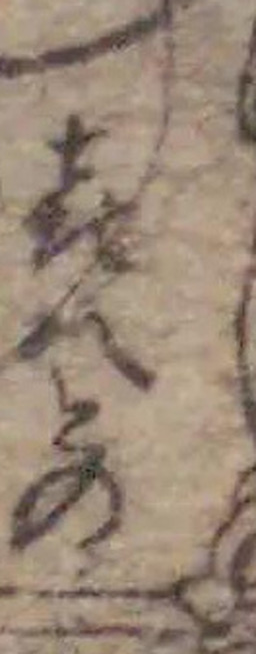喜八との

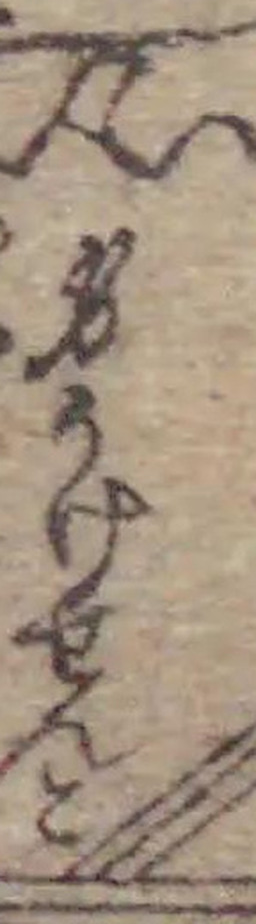身うけせんと
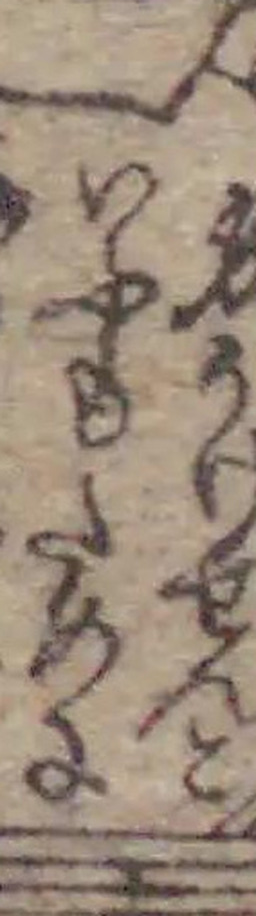いふもために
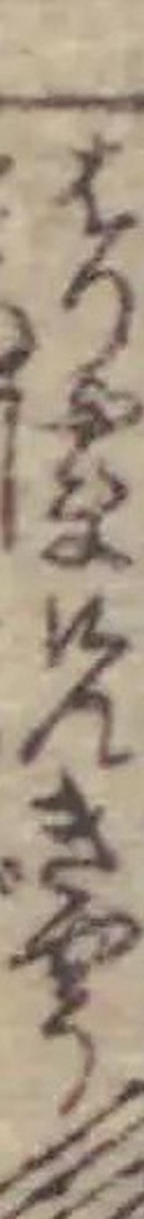はりやまけんきやう
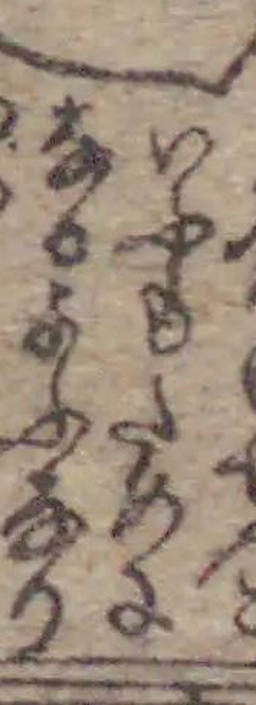なるよふなり
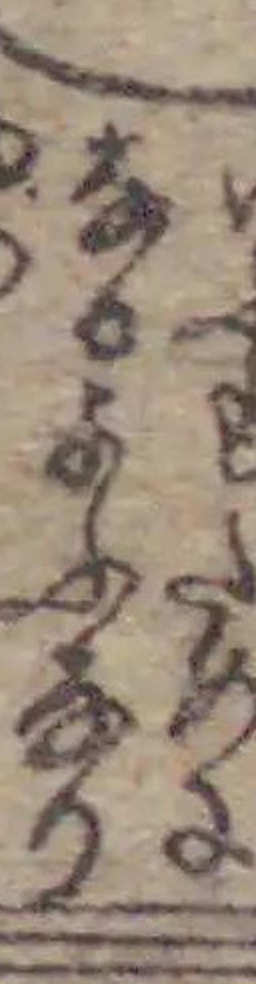なるよふなり
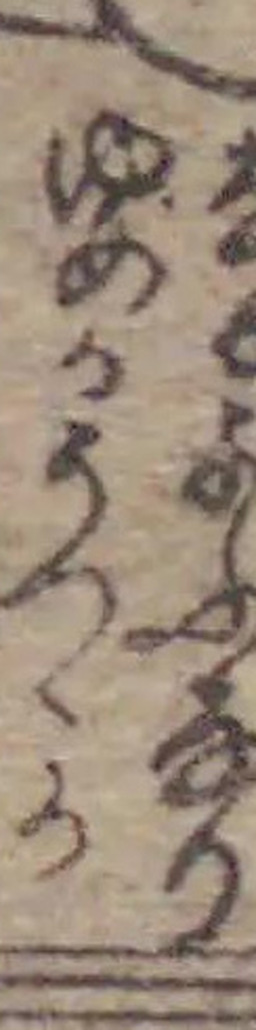ゆめかうつゝか
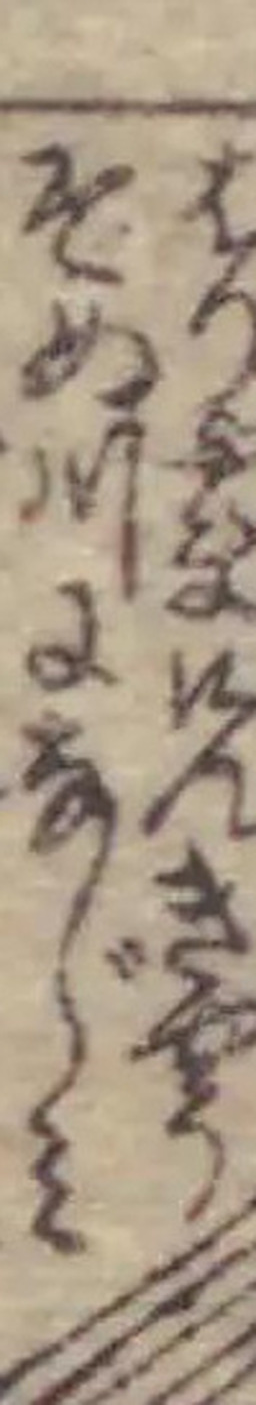そめ川になじみ
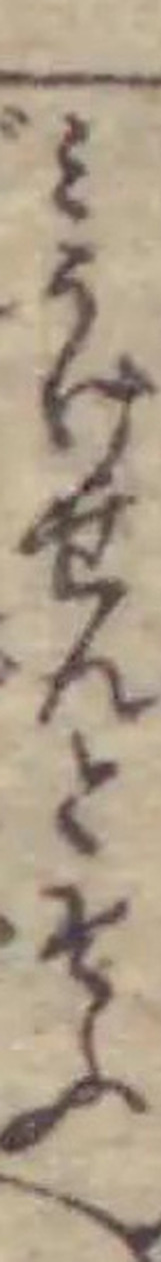みうけせんとそふ
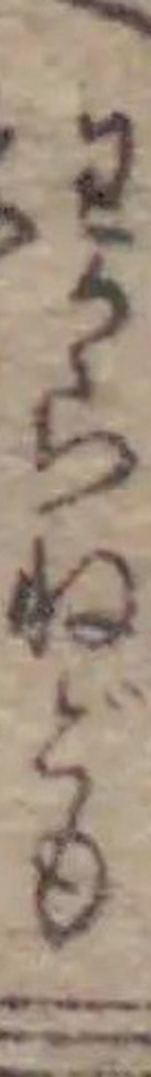わからねども
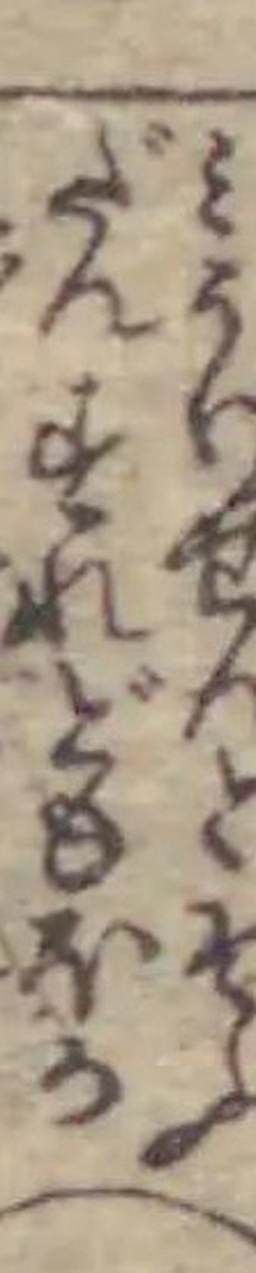だんすれどもほか
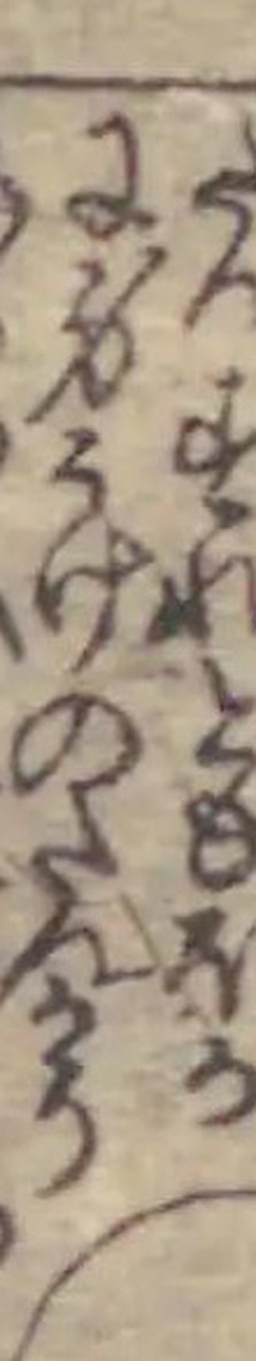に身うけのたんかう
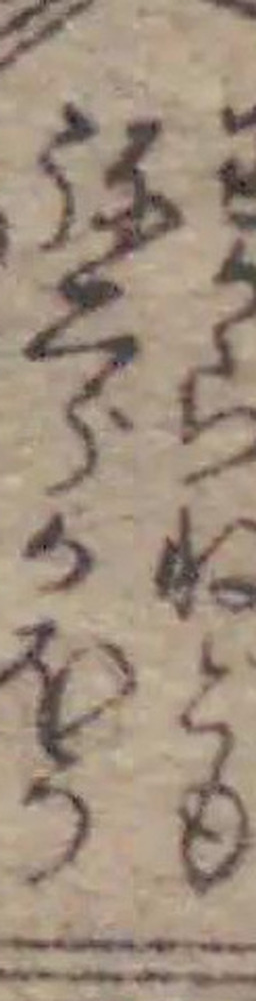弥二郎かほう
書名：虚言弥二郎傾城誠 3巻
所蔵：国立国会図書館 National Diet Library, JAPAN
